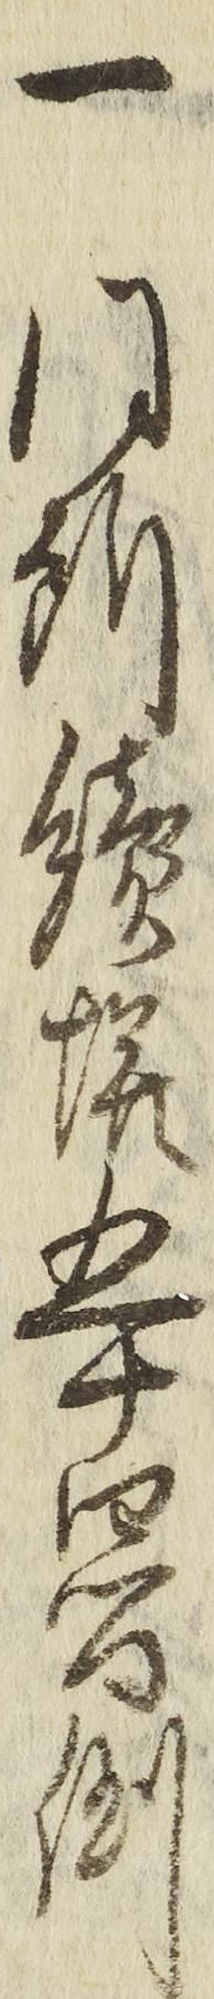一同所続塀五十四間倒
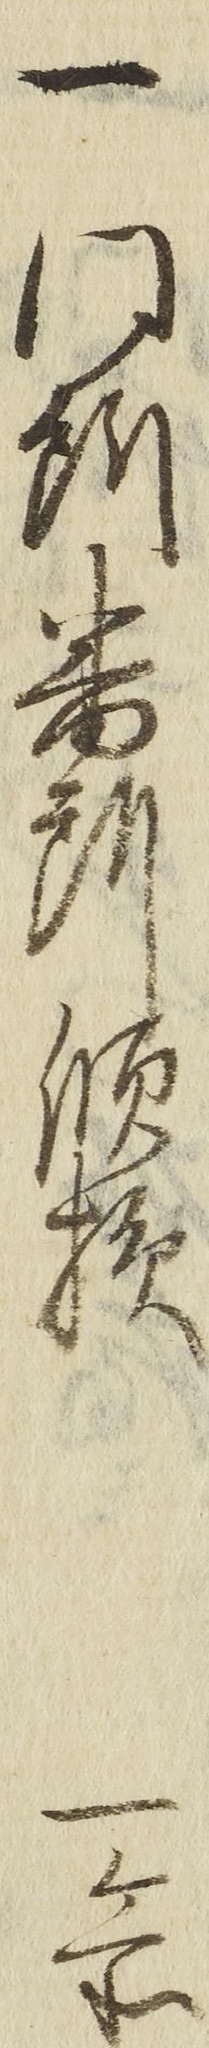一同所番所傾損一ヶ所
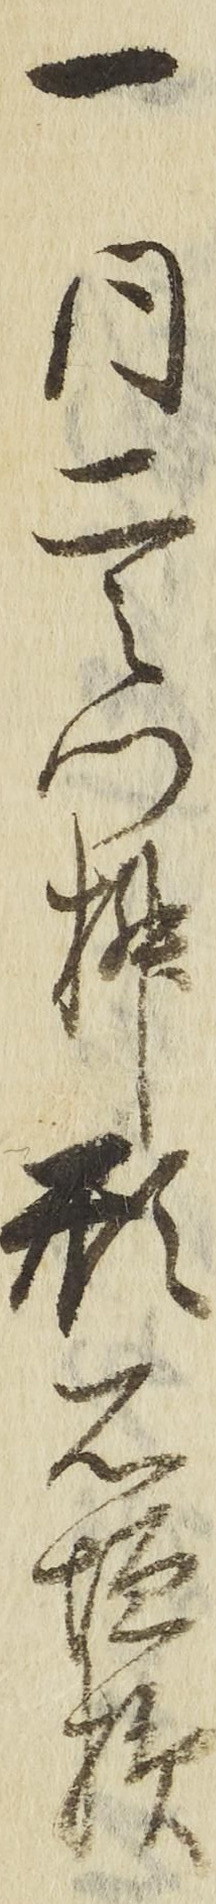一同二之門桝形石垣損

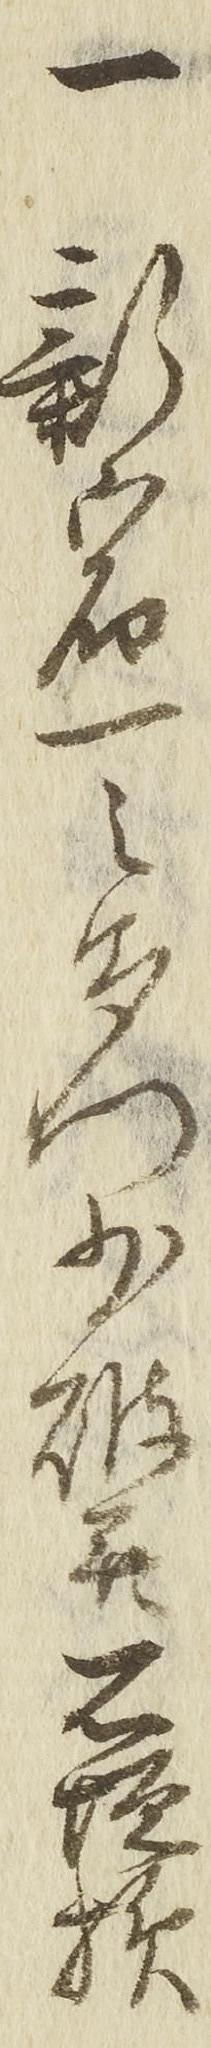一新宿一之多門少破并石垣損
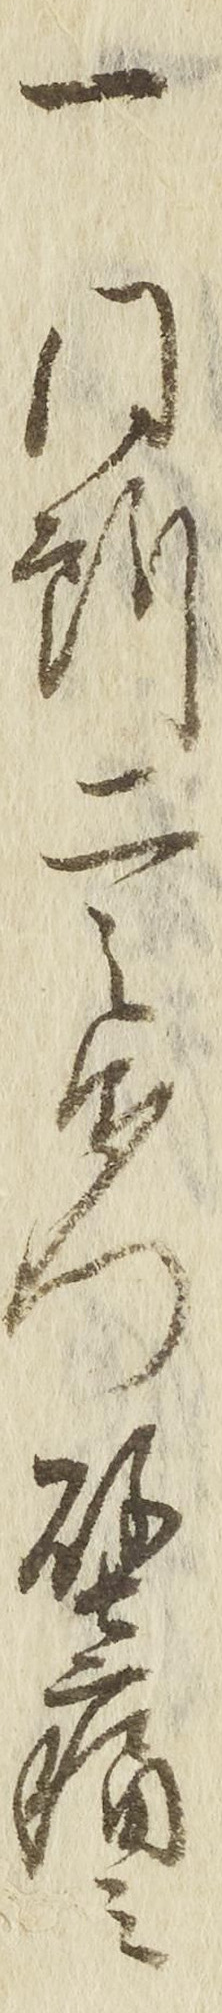一同所二之多門壁痛ミ
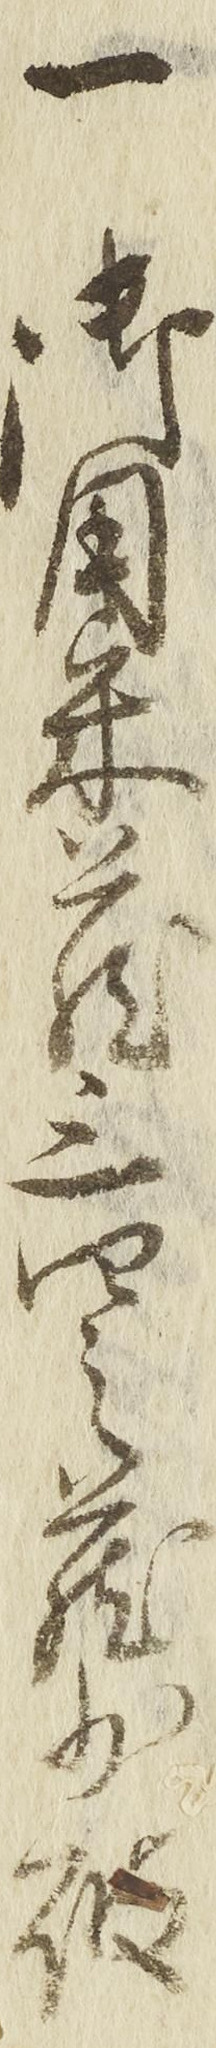一御用米蔵三四之蔵少破
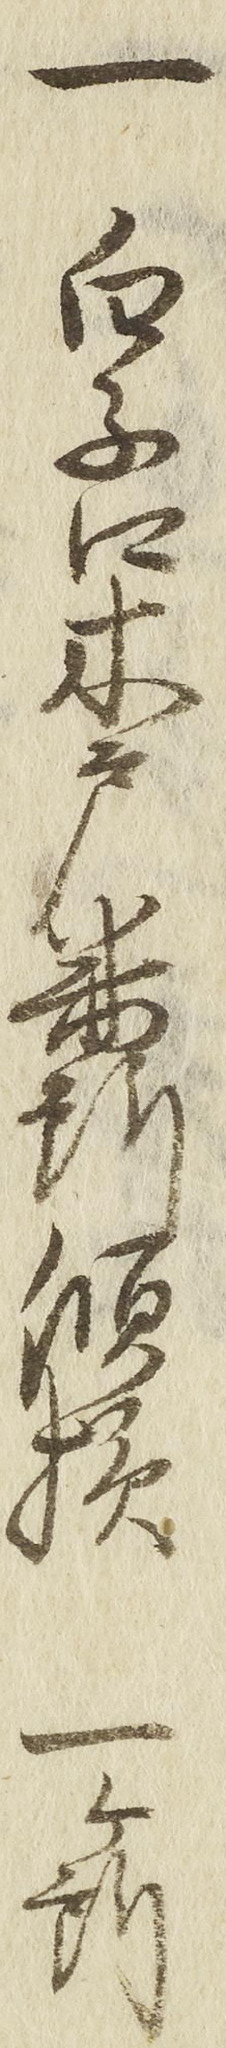一白子口木戸番所傾損一ヶ所
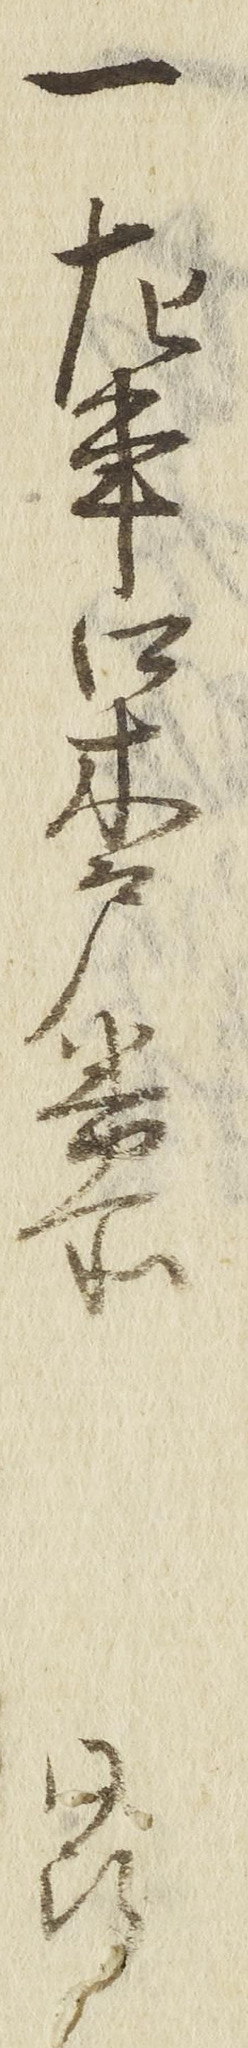一左事口木戸番所同断
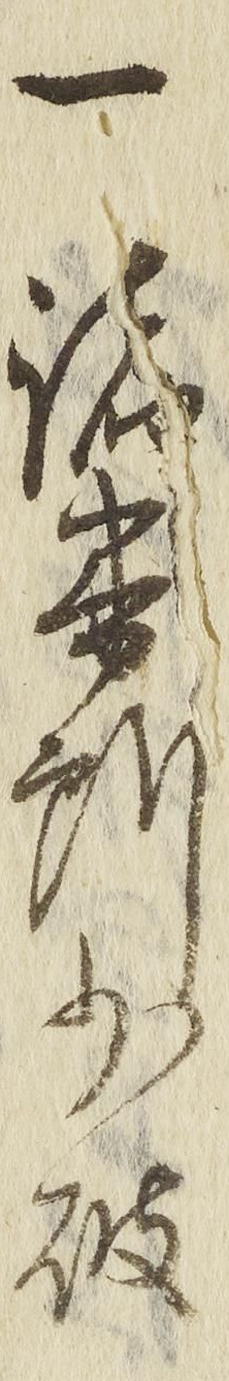一諸番所少破
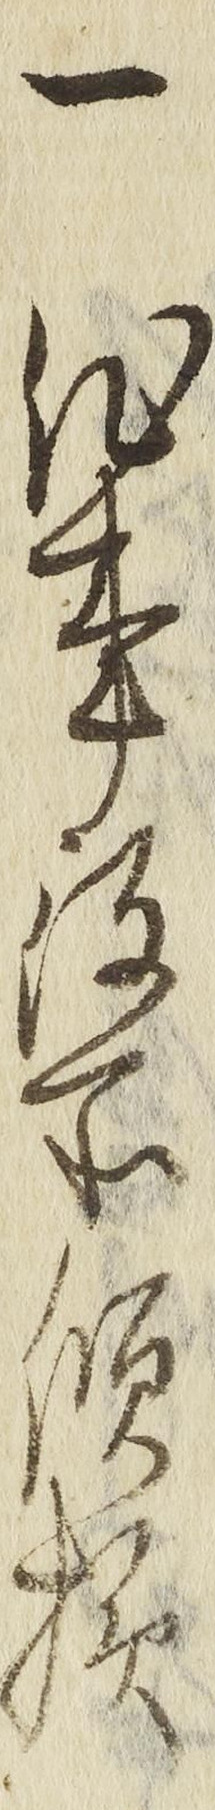一作事役所傾損同
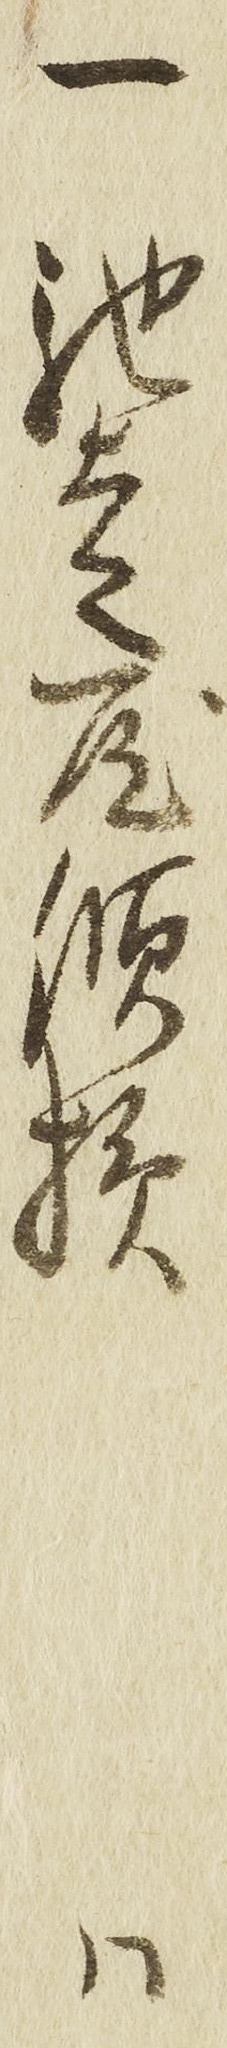一馳走屋傾損同
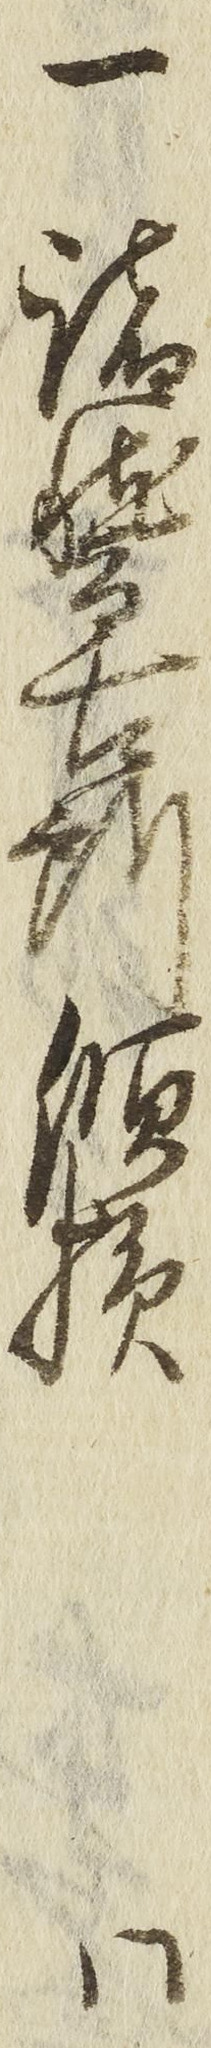一諸稽古所傾損同
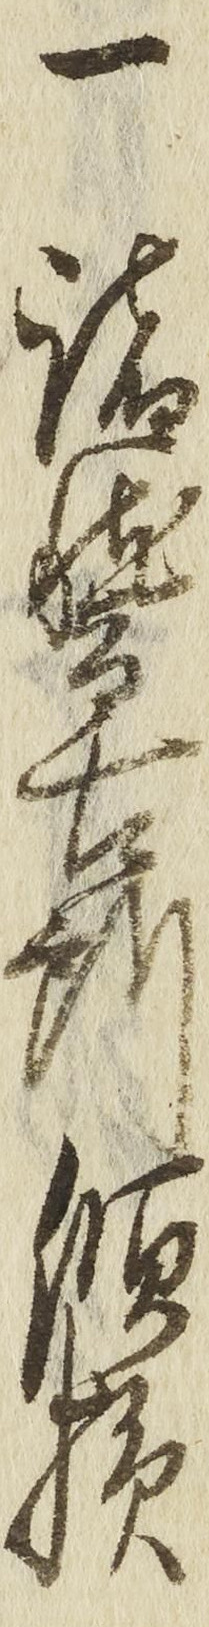一諸稽古所傾損同
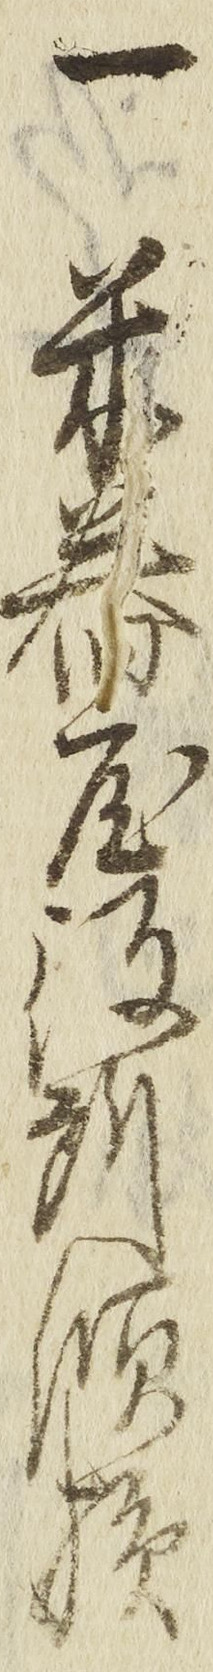一米舂屋役所傾損同
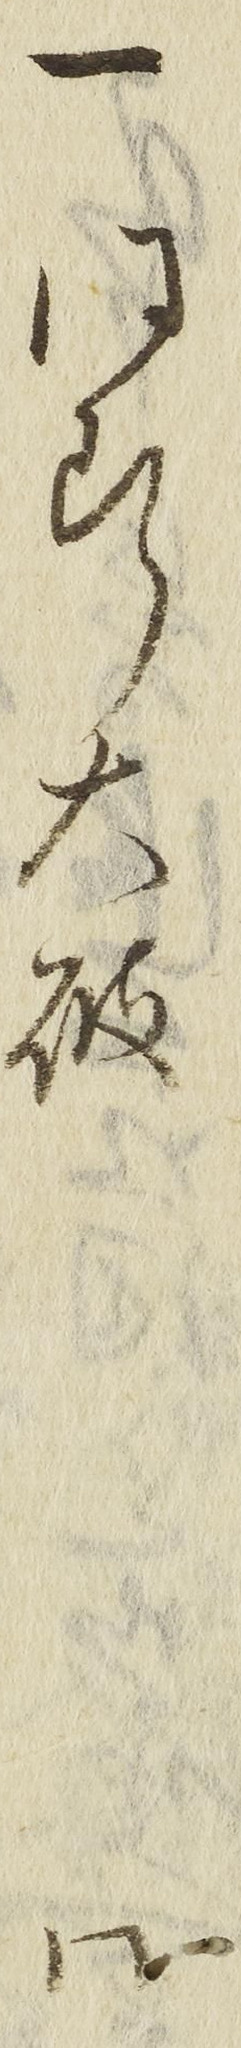一同断大破同
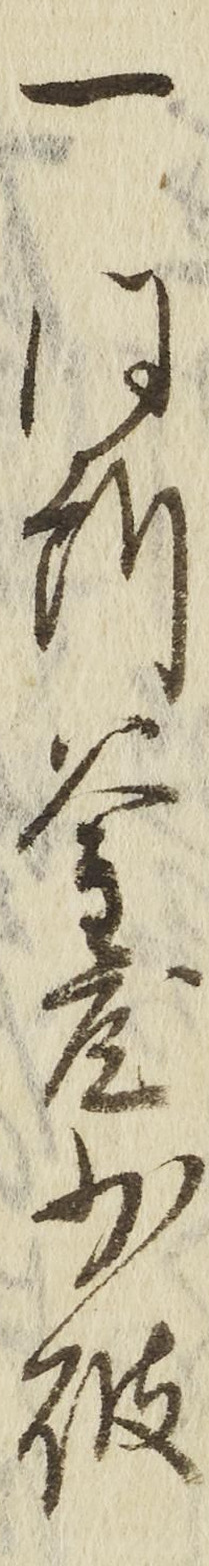一同所釜屋少破同
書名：世説ヤンレフシ写、駿州田中城地震ニ付内外破損御届書、豫州大洲城地震ニ付内外破損御届書・封廻状
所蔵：東京大学地震研究所図書室 Earthquake Research Institute Library, The University of Tokyo, JAPAN
